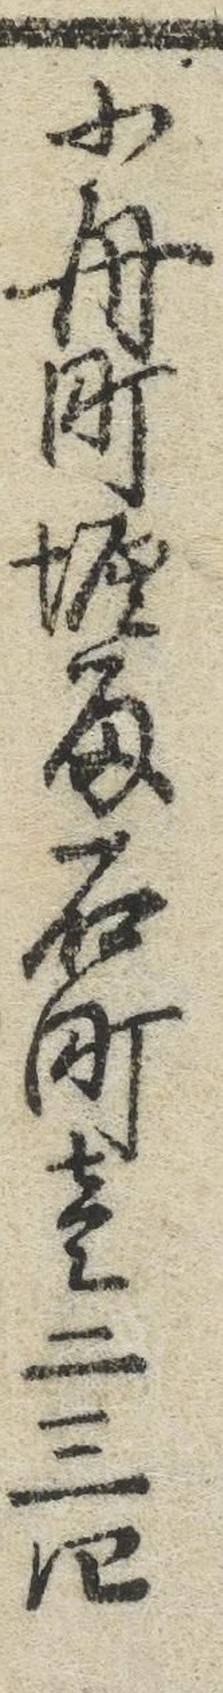小舟町堀留石町壱二三四御
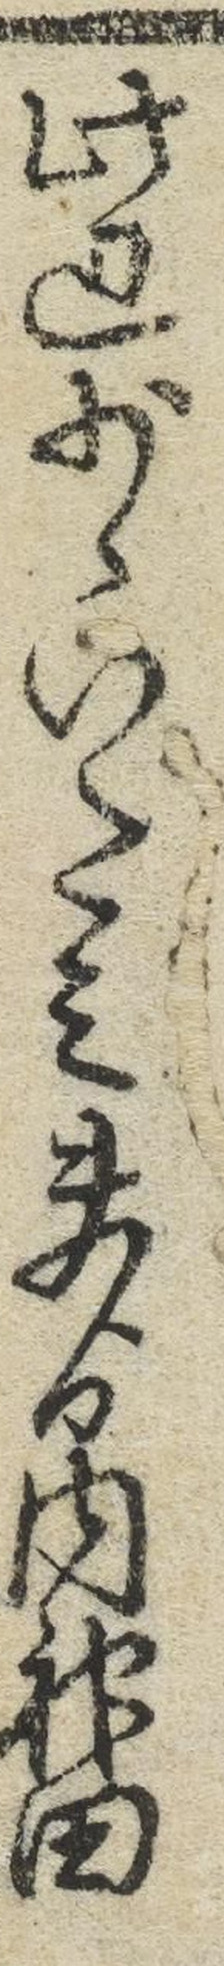此辺少々いたみ夫ゟ内神田
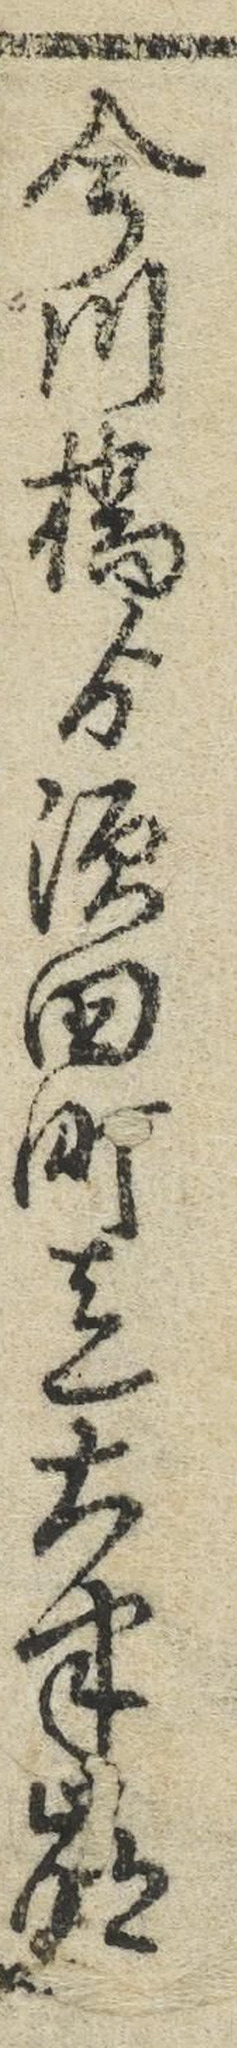今川橋ゟ須田町迄大半崩城
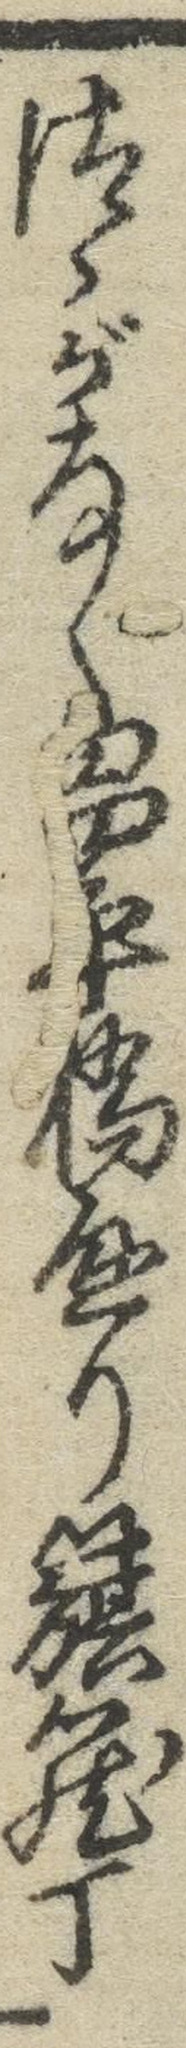つゝがなく昌平橋通り旅籠丁
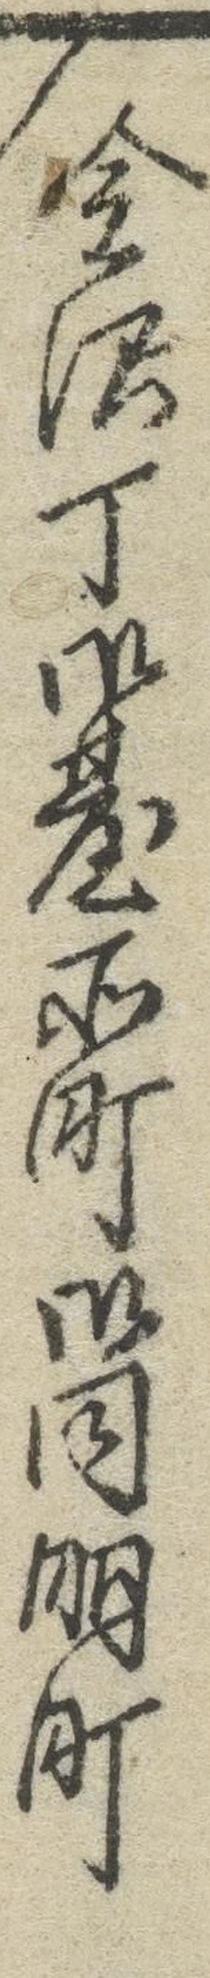金沢丁御台所町御同朋町
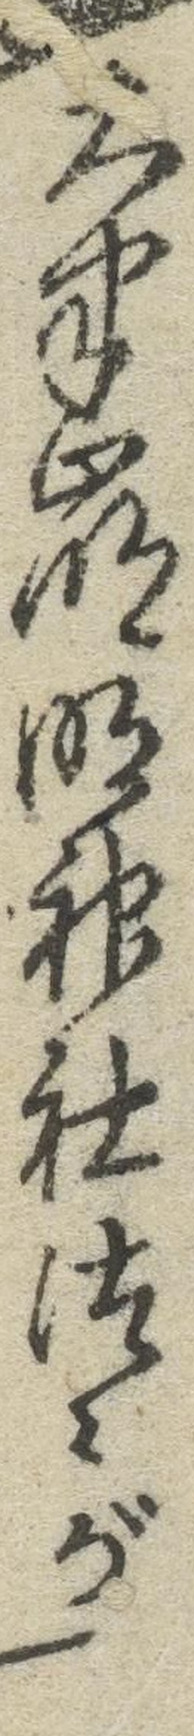大半崩明神社つゝが
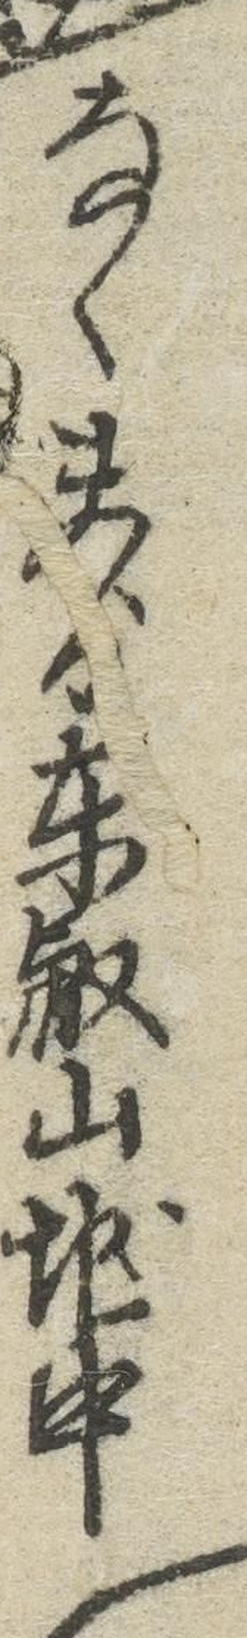なく夫ゟ東叡山地中
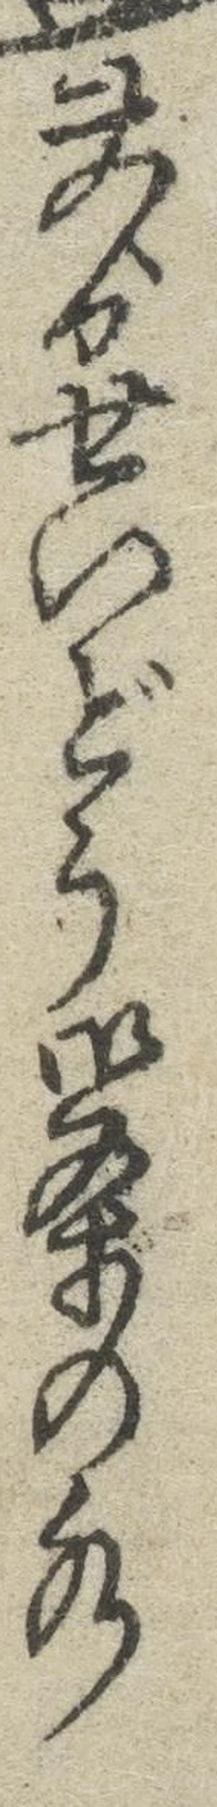夫ゟせいどう御茶の水
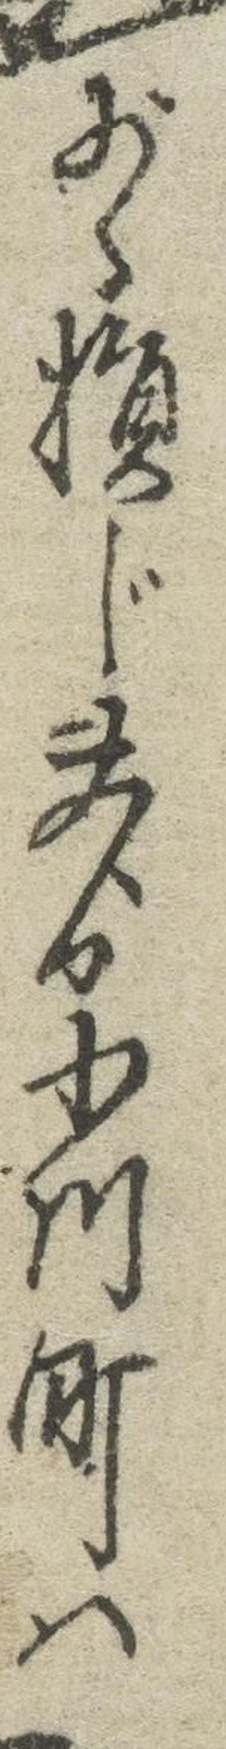少ゝ損じ夫ゟ小川町は
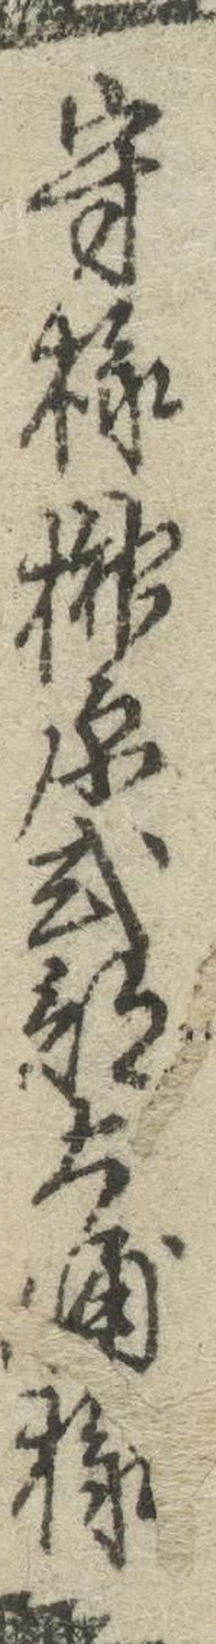守様榊原式部大輔様

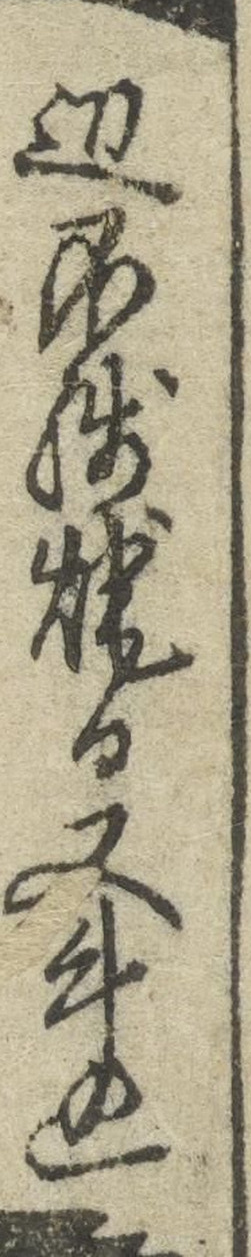辺不残焼る又牛込
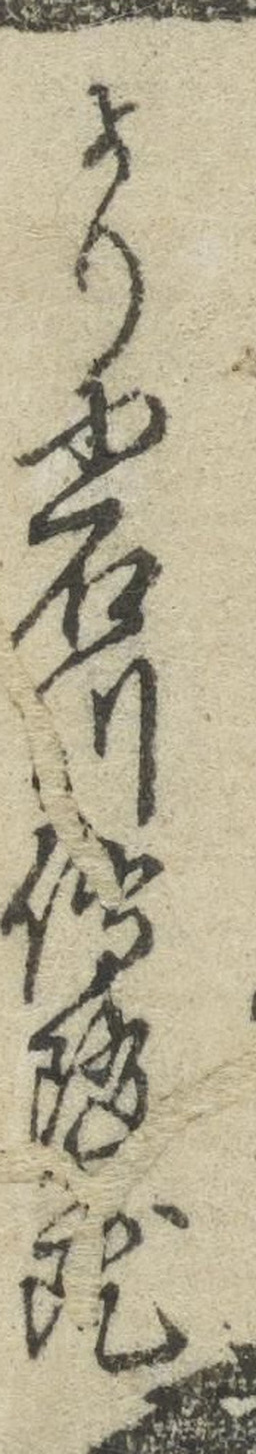より小石川傳随院
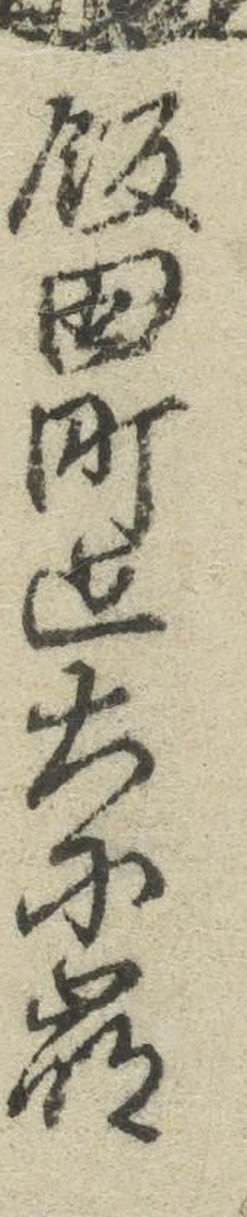飯田町辺大に崩
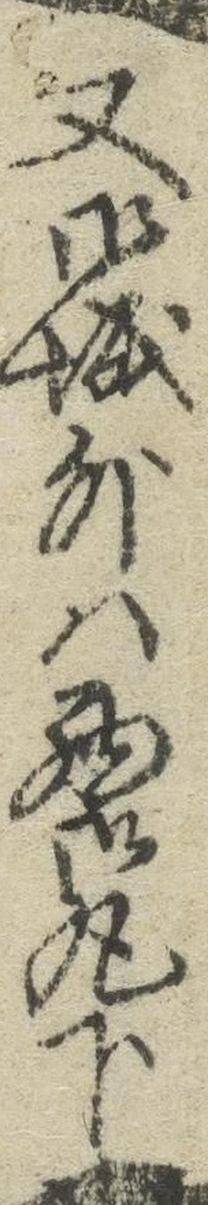又御城外ハ西御丸下
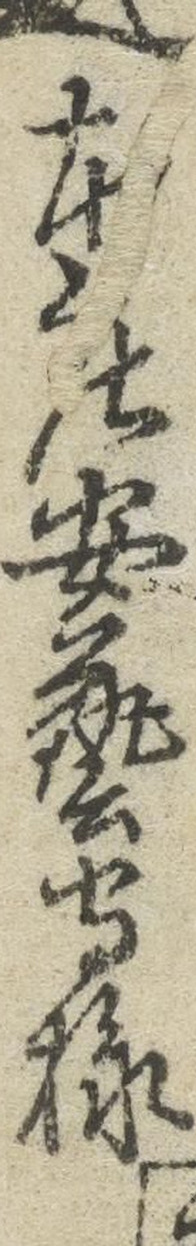本庄安芸守様
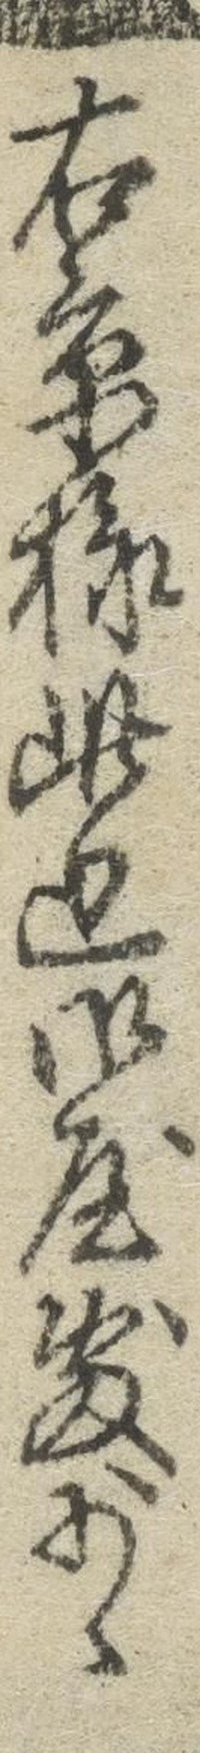右京様此辺御屋敷少々
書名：関東五街道　江戸大地震出火場所
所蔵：東京大学地震研究所図書室 Earthquake Research Institute Library, The University of Tokyo, JAPAN
